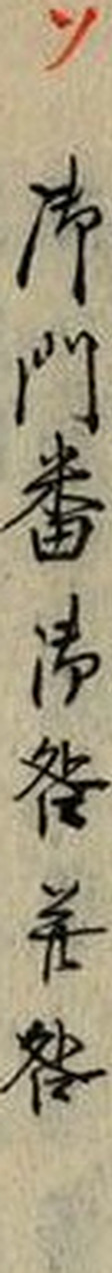ソ御門番御咎并咎
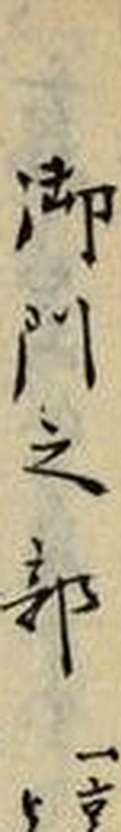御門之部
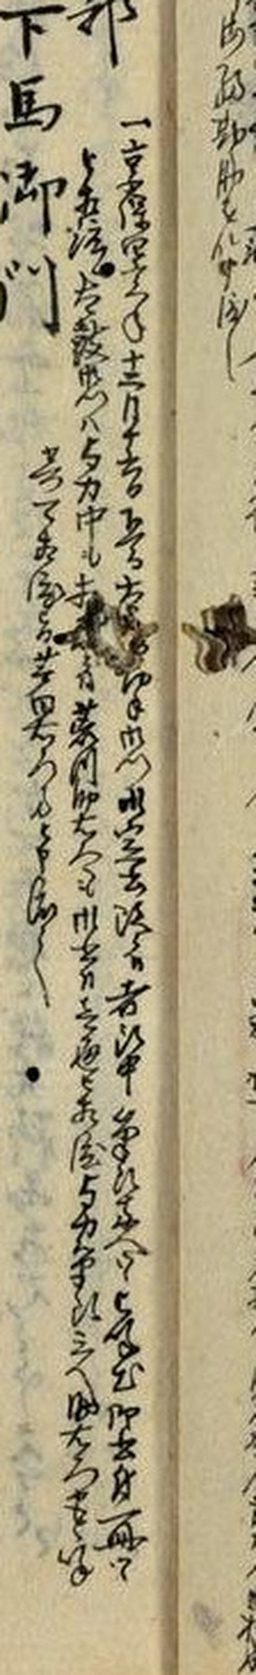一享保四亥年十二月十六日下馬太鼓切手御門御定書改ニ付者頭中筆頭両人ツヽ被呼出御書付一冊ツヽ
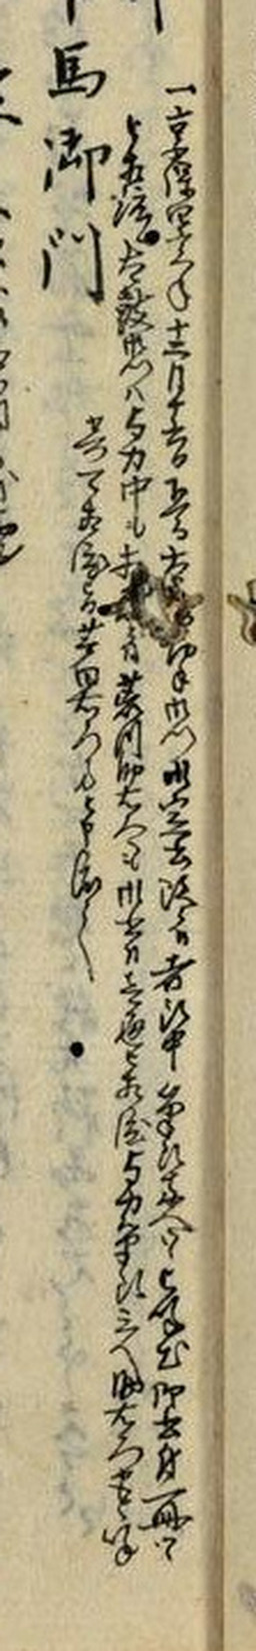被相渡但太鼓御門ハ与力中も相勤候ニ付荒川助右衛門も御書付壱通被相渡与力筆頭三人助右衛門も呼
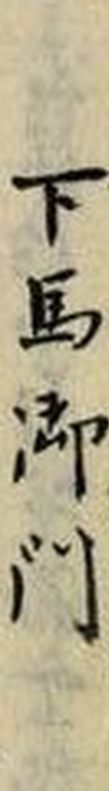下馬御門
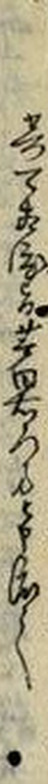寄可相渡旨芦田右衛門方被申渡之
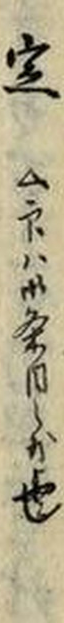定△印ハ御条目之外也
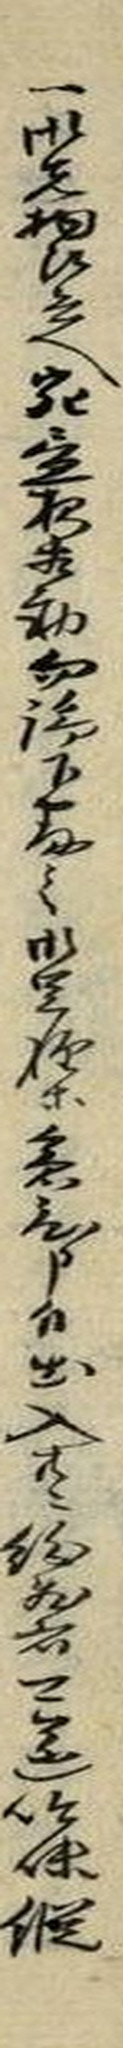一御先物頭壱人宛昼夜相勤勿論下番之御足軽等急度申付出入共ニ紛敷者可遂吟味縦
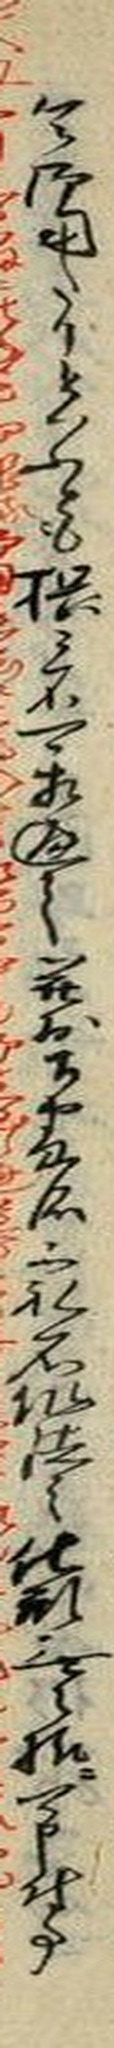令御用たりといふとも猥ニ不可相通之并於下番所不礼不作法之仕形無之様ニ可申付事
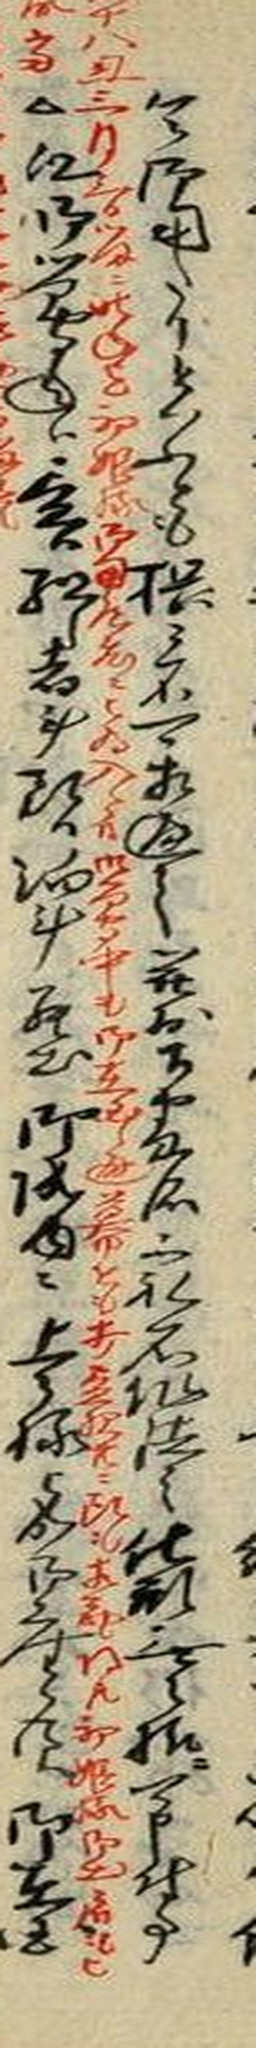△但御留守年ハ昼ハ組之者斗頭ハ泊斗罷出御城内ニ上々様被成御座候得ハ御在国
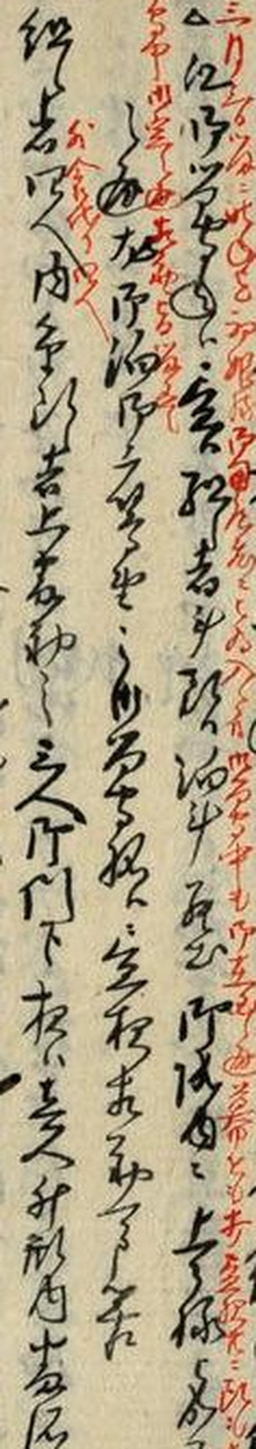之通尤御泊御鷹野之御留守抔ハ昼夜相勤可申筈
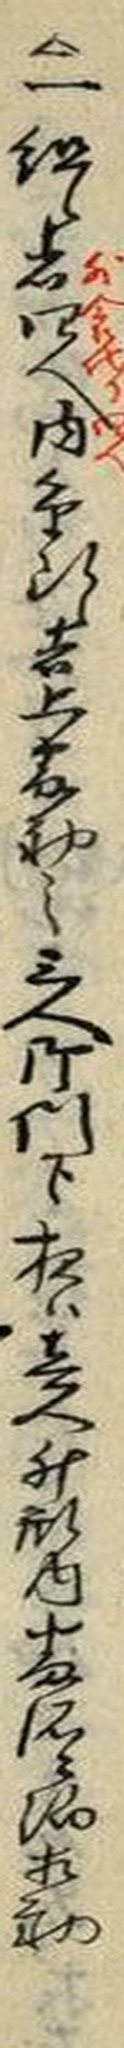△一組之者四人内筆頭之者上番勤之三人御門下夜ハ壱人升形内番所ニ泊相勤
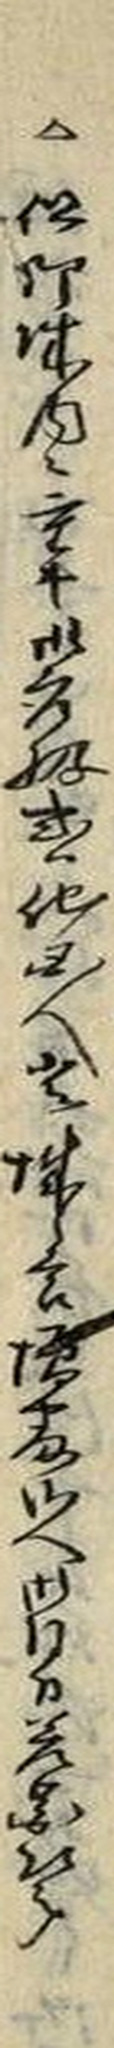△但御城内之重キ御取扱或ハ他国人登城之節増番弐人御目付差図次第
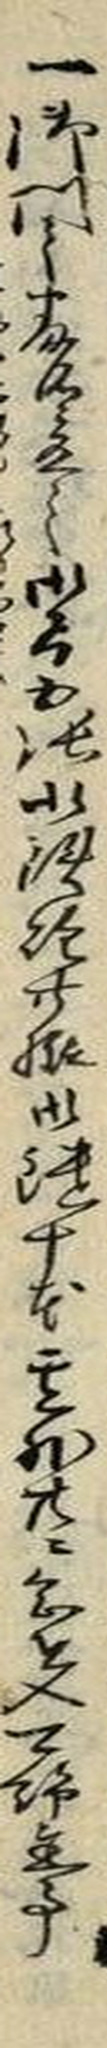一御門之番所ニ有之御弓五張御鉄炮廿挺御鑓十本其外共二念を入可飾置事
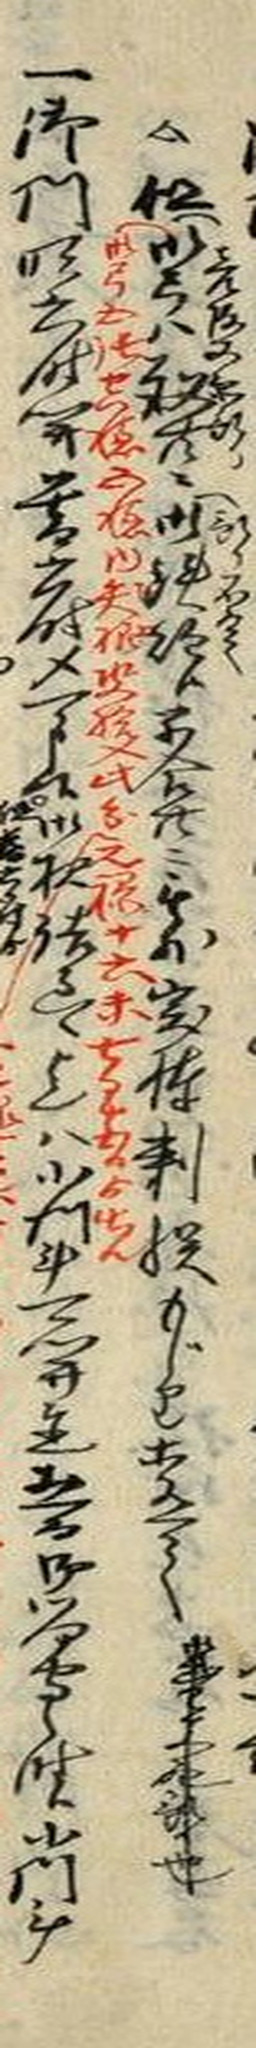一御門明六時開暮六時〆可申候但暮六時ゟ御夜詰過候迄ハ小門斗可開置惣而御留守之時ハ小門斗
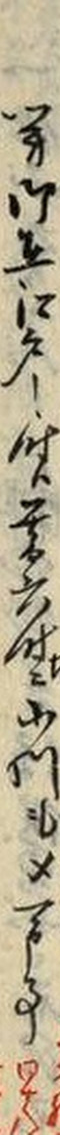并御在江戸之時ハ暮六時切ニ小門も〆可申事
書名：御門御櫓之部
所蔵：福井県文書館 Fukui Prefectural Archives
